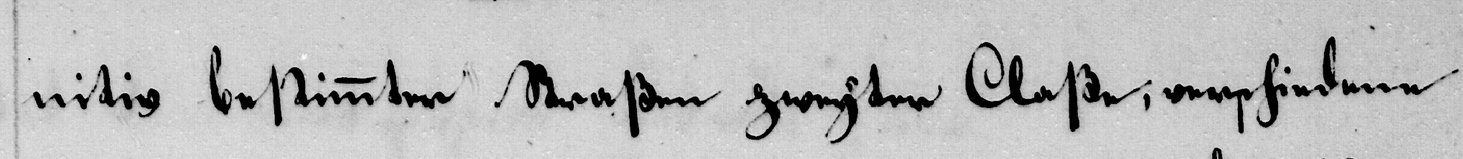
nitiv bestimmten Straßen zweyter Claße, verschiedene
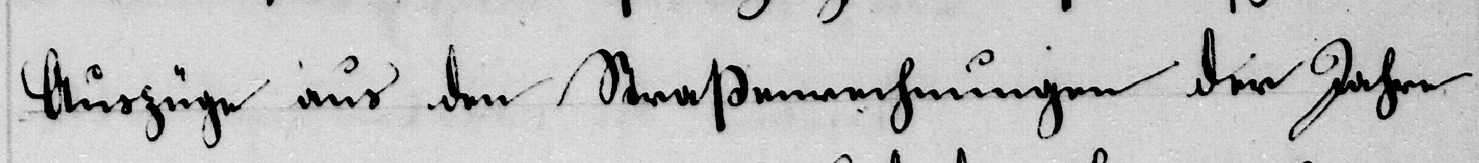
Auszüge aus den Straßenrechnungen der Jahre
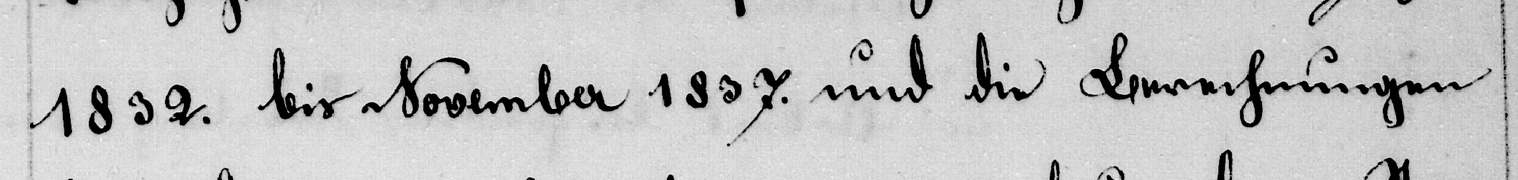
1832. bis November 1837. und die Berechnungen
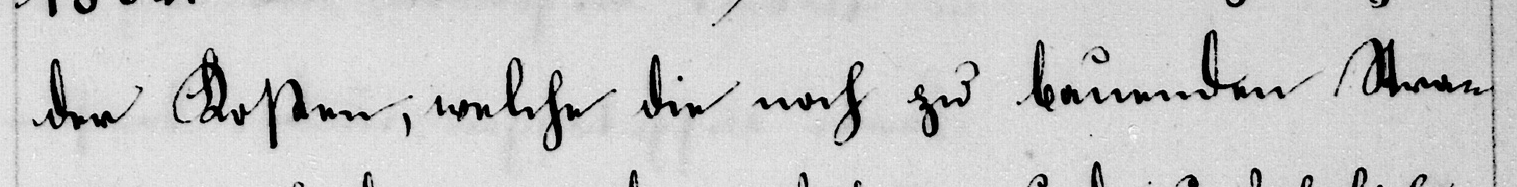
der Kosten, welche die noch zu bauenden Stra¬
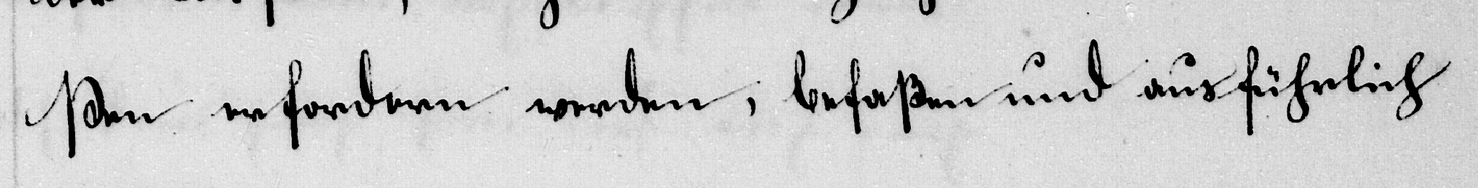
ßen erfordern werden, befaßen und ausführlich
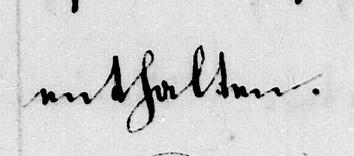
enthalten.
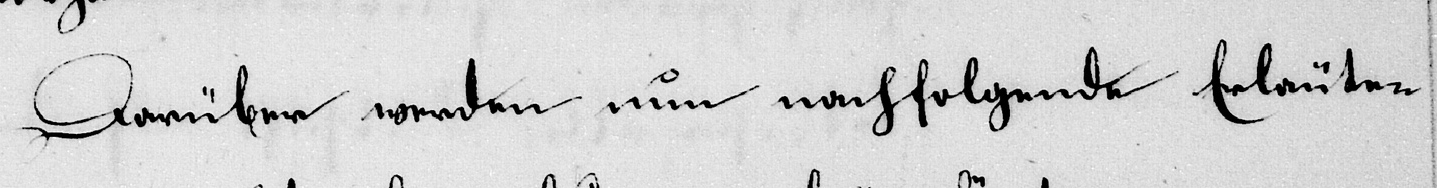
Darüber werden nun nachfolgende Erläute¬
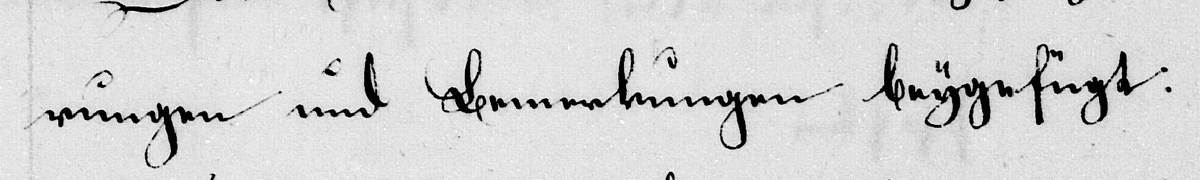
rungen und Bemerkungen beygefügt:
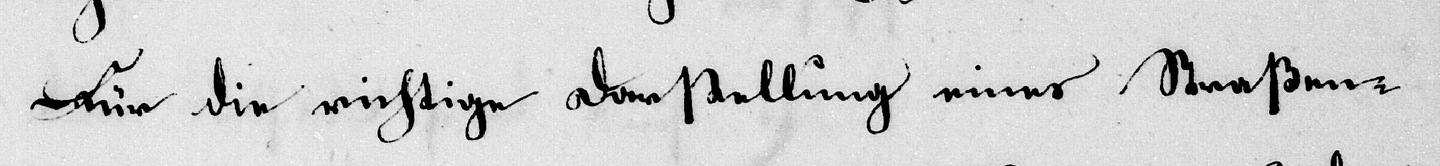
Für die richtige Darstellung eines Straßen¬
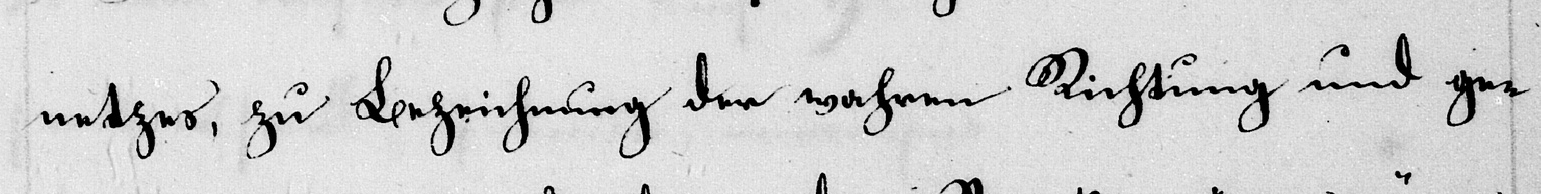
netzes, zu Bezeichnung der wahren Richtung und ge¬
